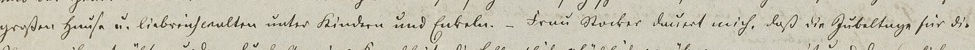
großen Hause u. liebreich walten unter Kindern und Enkeln. – Frau Stocker dauert mich, daß die Jubeltage für die
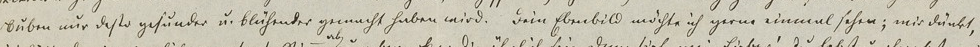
Buben nur desto gesunder u. blühender gemacht haben wird. Dein Ebenbild möchte ich gerne einmal sehen; mir dünkt,
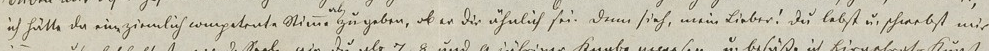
ich hätte da eine ziemlich competente Stimme abzugeben, ob es dir ähnlich sei. Denn sieh, mein Lieber! Du lebst u. schwebst mir
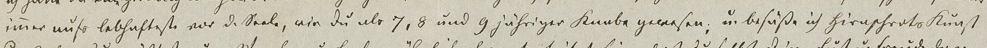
immer aufs lebhafteste vor d. Seele, wie Du als 7, 8 und 9 jähriger Knabe gewesen; u. besäße ich Hirnschrots Kunst
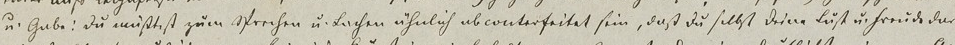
u. Gabe! Du müßtest zum Sprechen u. Lachen ähnlich abconterfeitet sein, daß Du selbst Deine Lust u. Freude daran
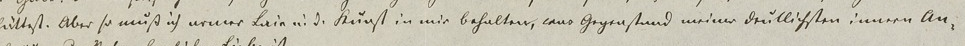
hättest. Aber so muß ich armer Laie in d. Kunst in mir behalten, was Gegenstand meiner deutlichsten innern An-
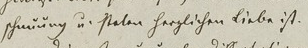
schauung u. steten herzlichen Liebe ist.
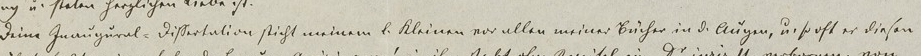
Deine Inaugural-Dissertation sticht meinem l. Kleinen vor allen meiner Bücher in d. Augen, u. so oft er diesen
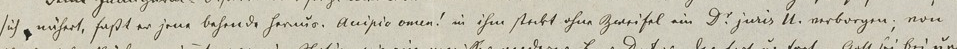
sich ... nähert, faßt er jene behende heraus. Accipio omen! in ihm steckt ohne Zweifel ein Dr juris U. verborgen; von
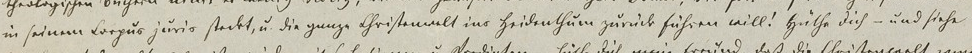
in seinem Corpus juris steckt, u. die ganze Christenwelt ins Heidenthum zurück führen will! Hüthe Dich – und siehe
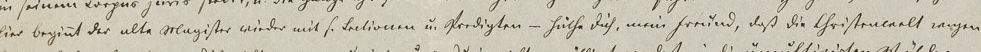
hier beginnt der alte Magister wieder mit s. Lectionen u. Predigten – hüthe Dich, mein Freund, daß die Christenwelt wegen
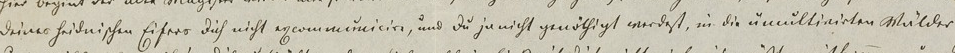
Deines heidnischen Eifers Dich nicht excommunicire, und Du ja nicht genöthigt werdest, in die uncultivirten Wälder
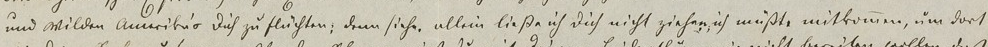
und Wilden Amerika's Dich zu flüchten; denn siehe, allein ließe ich Dich nicht ziehen; ich müßte mitkommen, um dort
